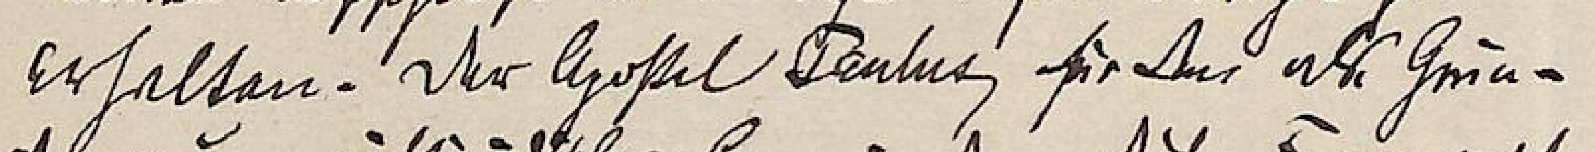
erhalten. Der Apostel Paulus, für den als Grün¬
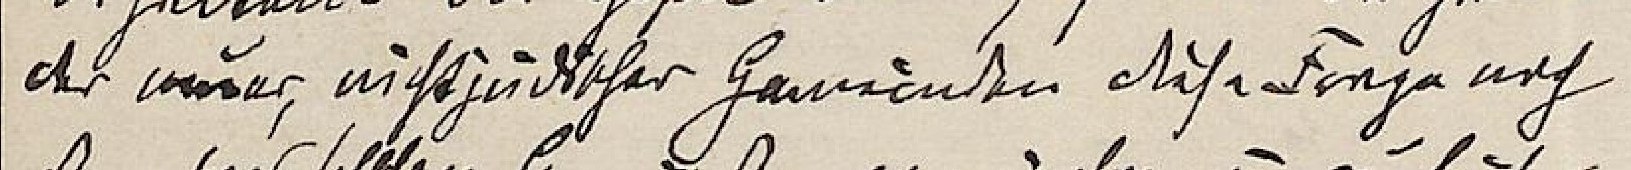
der neuer, christlicher Gemeinden diese Frage noch
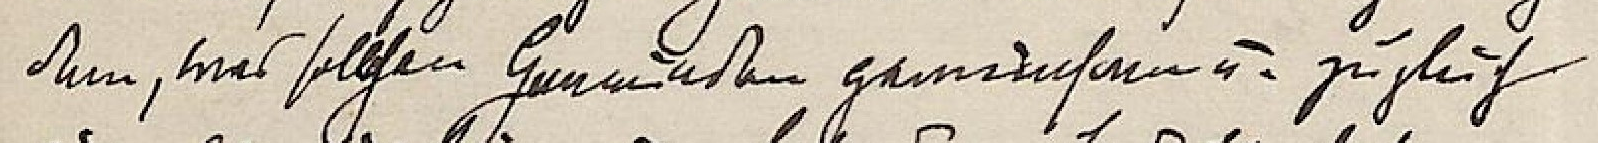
dem, was solche Gemeinden gemeinsam u. zugleich
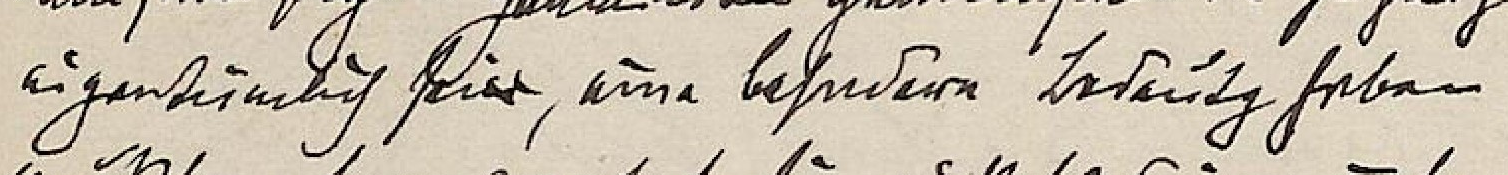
eigentümlich sei, eine besondere Bedeutg. haben
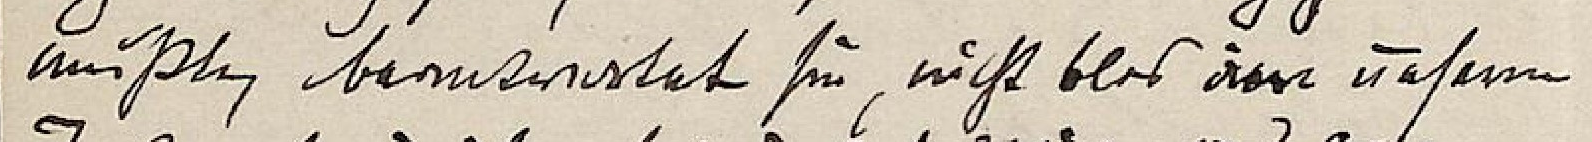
mußte, beantwortet sie, nicht blos im unserm
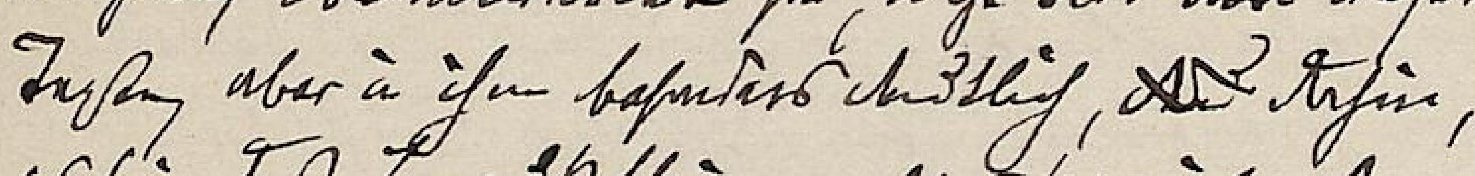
Texte, aber in ihm besonders deutlich, den dahin,
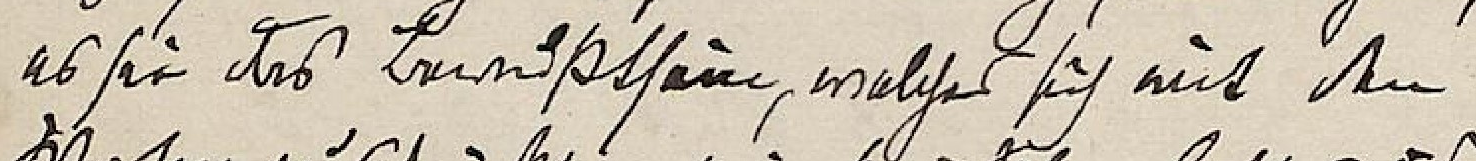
es sei das Bewußtsein, welches sich mit den
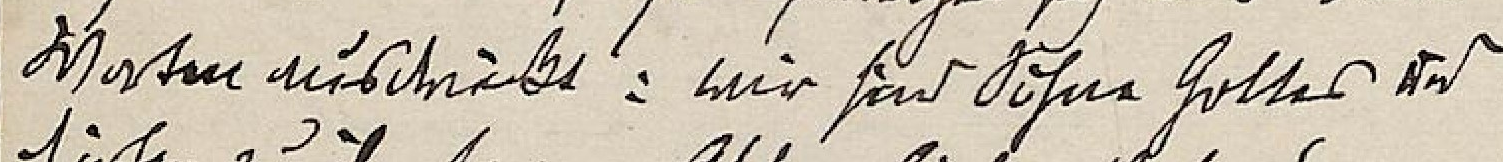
Worten ausdrückt: wir sind Söhne Gottes und
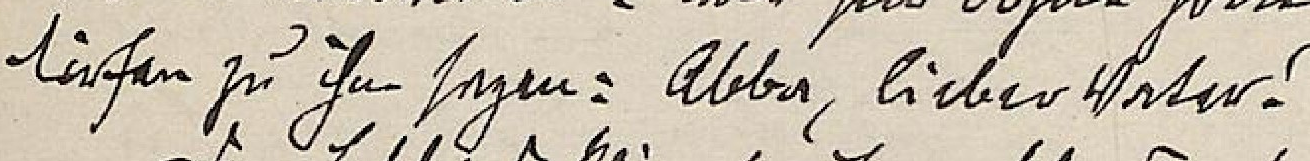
dürfen zu ihm sagen: Abba, lieber Vater!
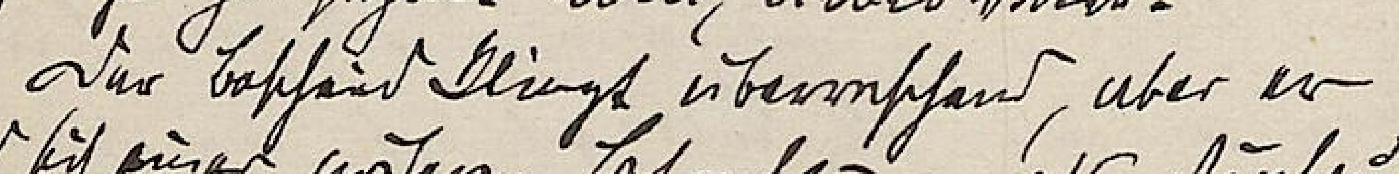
Der Bescheid klingt überraschend, aber er
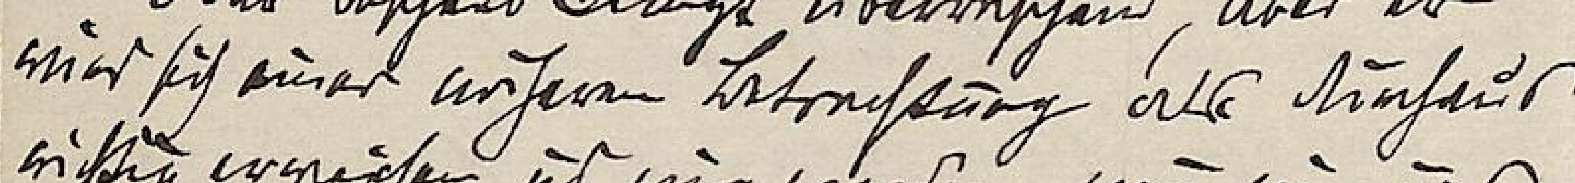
wird sich einer näheren Betrachtung als durchaus
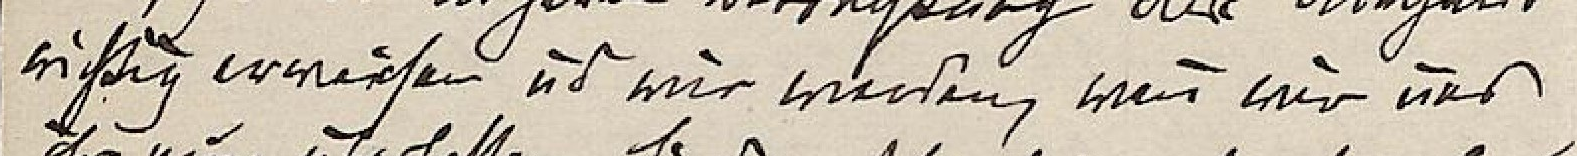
richtig erwiesen und wir werden, wen wir uns
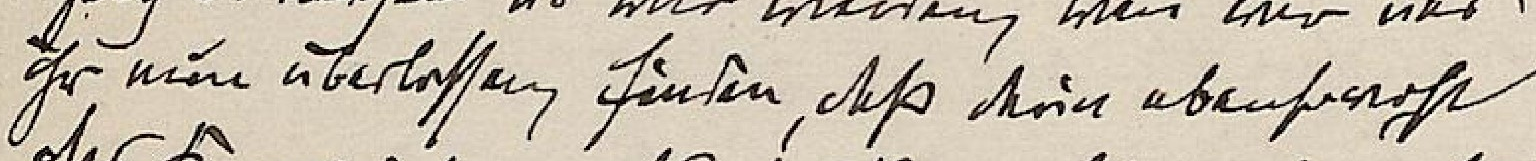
ihr neun überlassen, finden, daß darin ebensowohl
